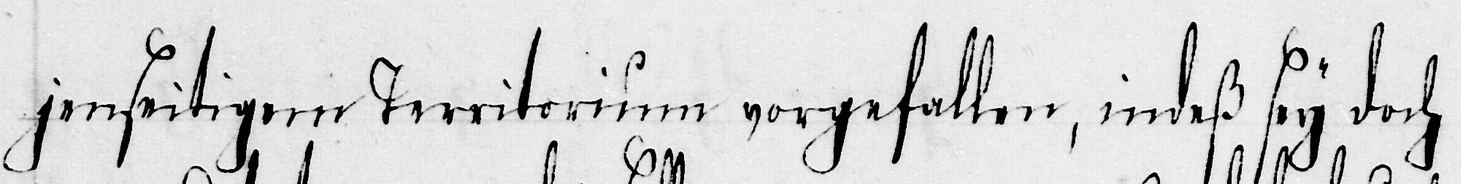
jenseitigem Territorium vorgefallen, indeß sey doch
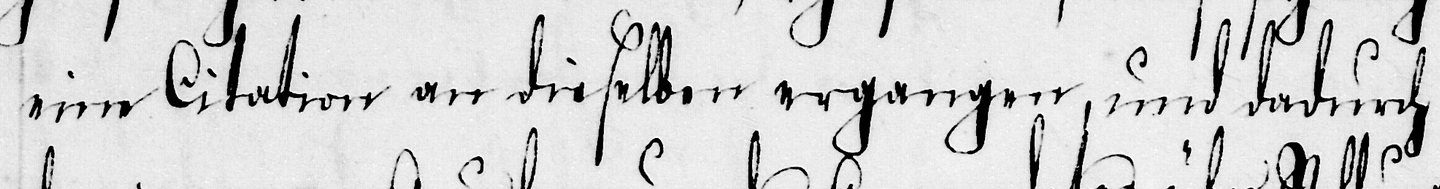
eine Citation an dieselben ergangen, und dadurch
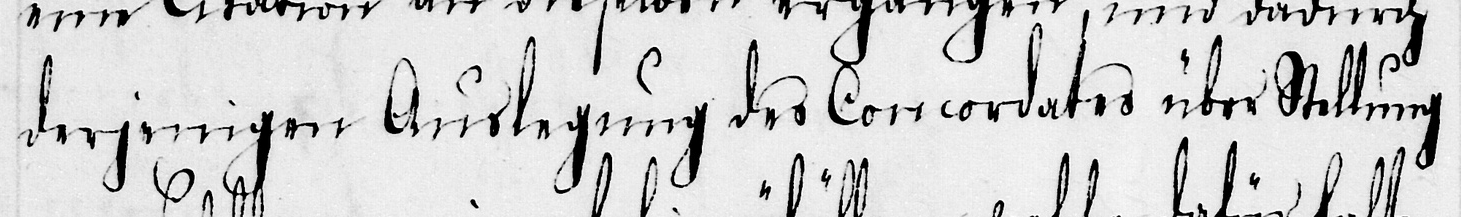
derjenigen Auslegung des Concordates über Stellung
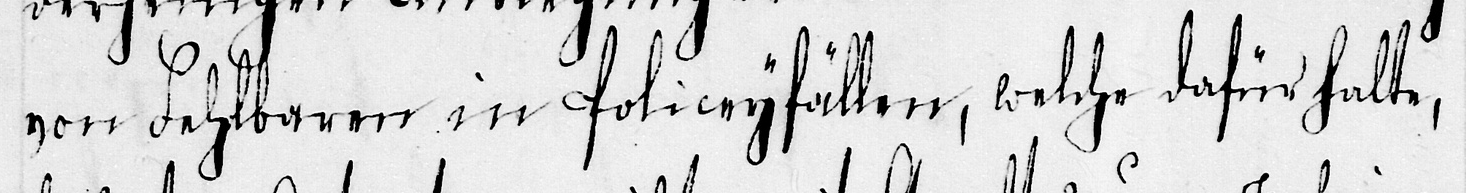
von Fehlbaren in Policeyfällen, welche dafür halte,
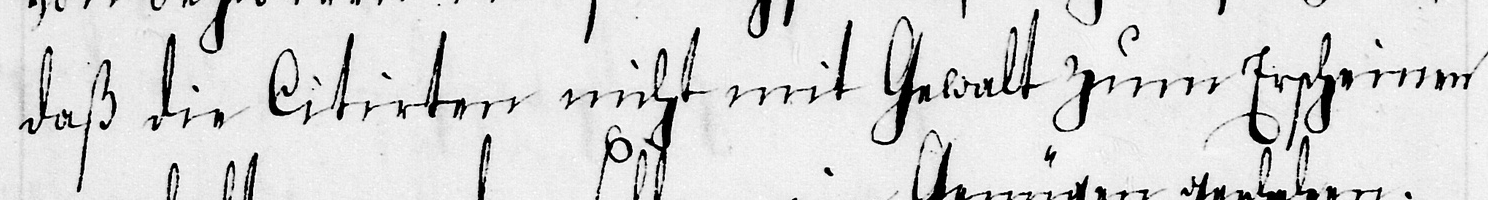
daß die Citirten nicht mit Gewalt zum Erscheinen
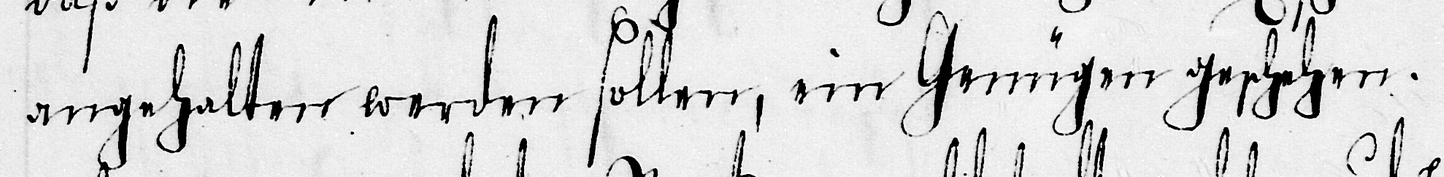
angehalten werden sollen, ein Genügen geschehen.
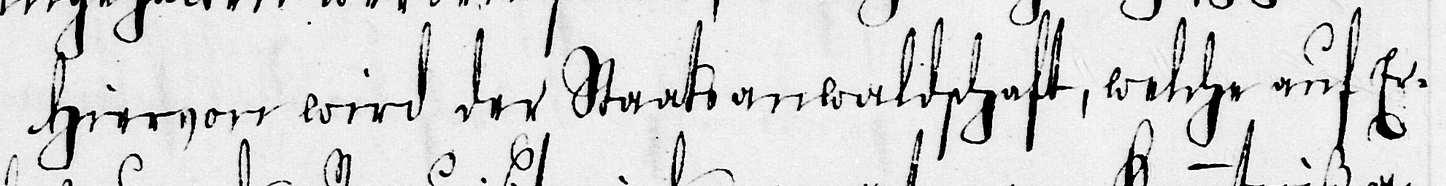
Hiervon wird der Staatsanwaldschaft, welche auf Er¬
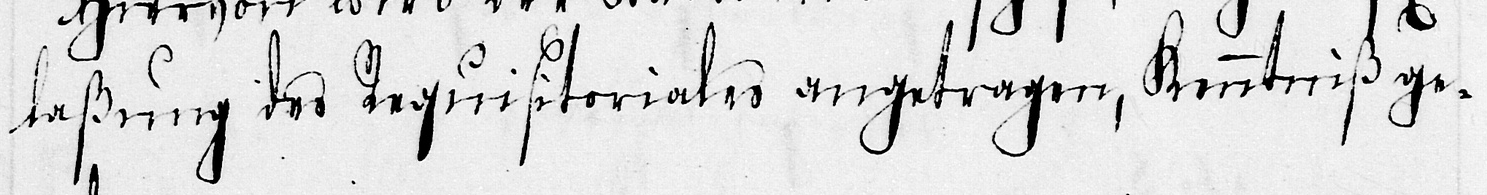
laßung des Requisitoriales angetragen, Kenntniß ge¬
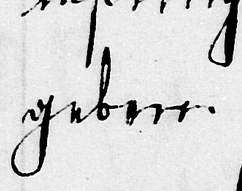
geben.
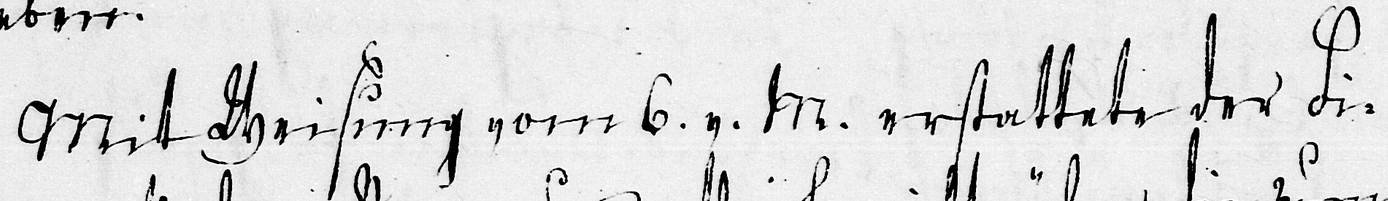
Mit Weisung vom 6. v. M. erstattete der Fi¬
